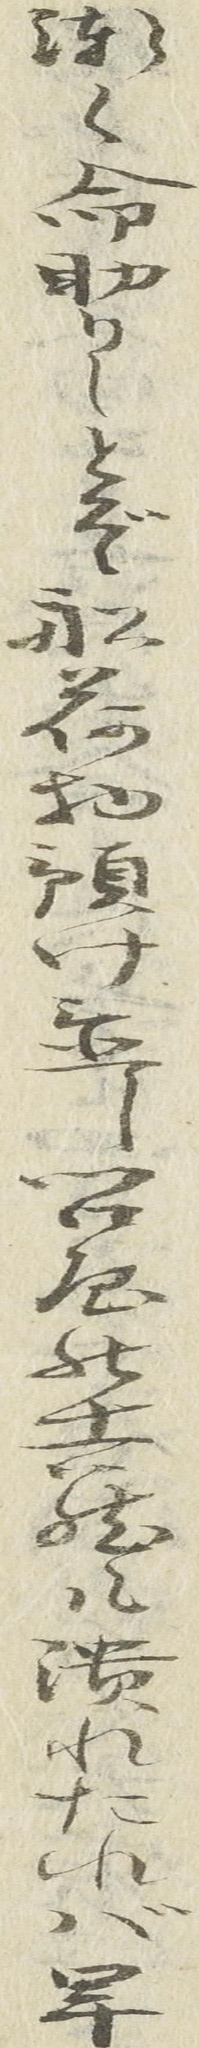漸く命助りしとぞ船荷物預け置し問屋の土蔵も潰れたれば早
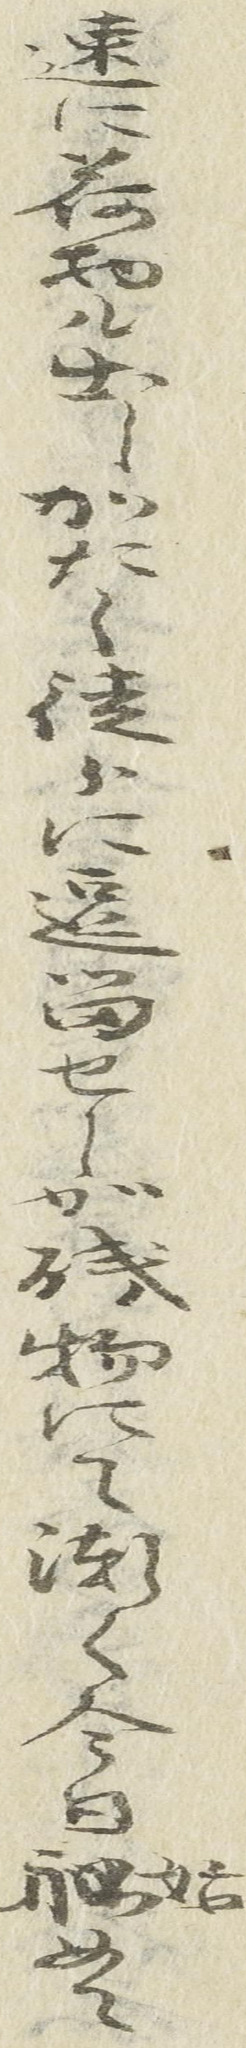速に荷物も出しかたく徒らに逗留せしが残物にて漸く今日始めて
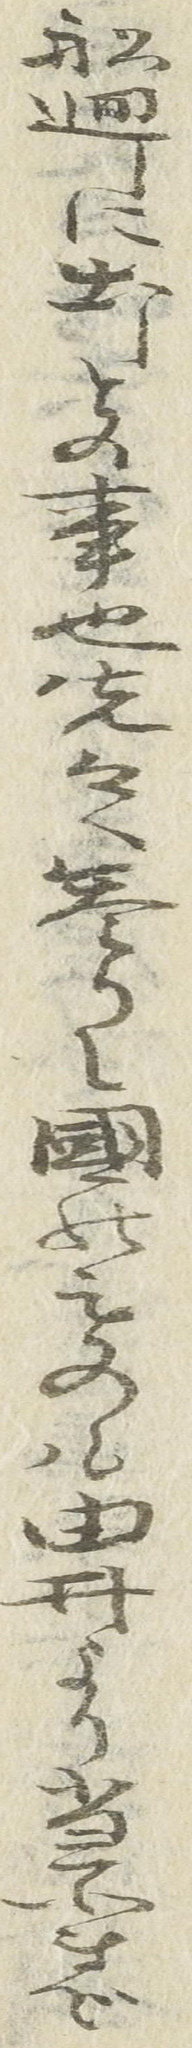舩廻しに出しとの事也先々へ参りて国のものも由井より当所まで
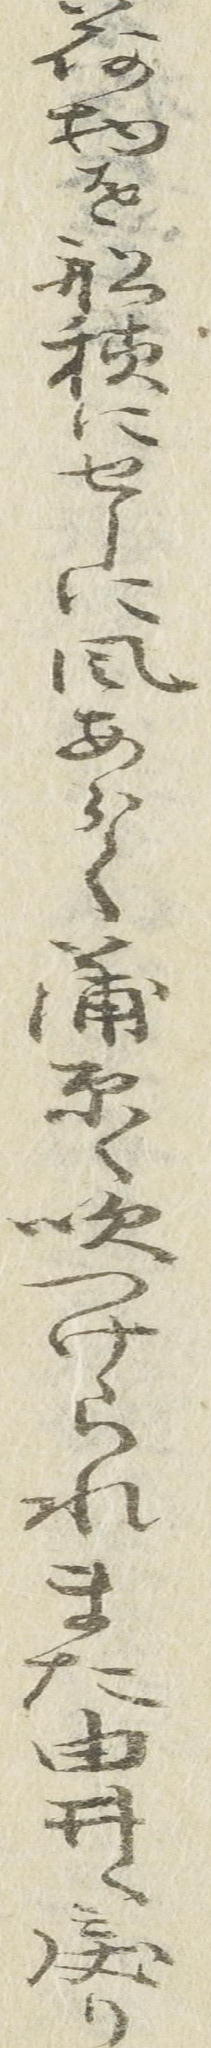荷物を舩積にせしに風あらく蒲原へ吹つけられまた由井へ戻り
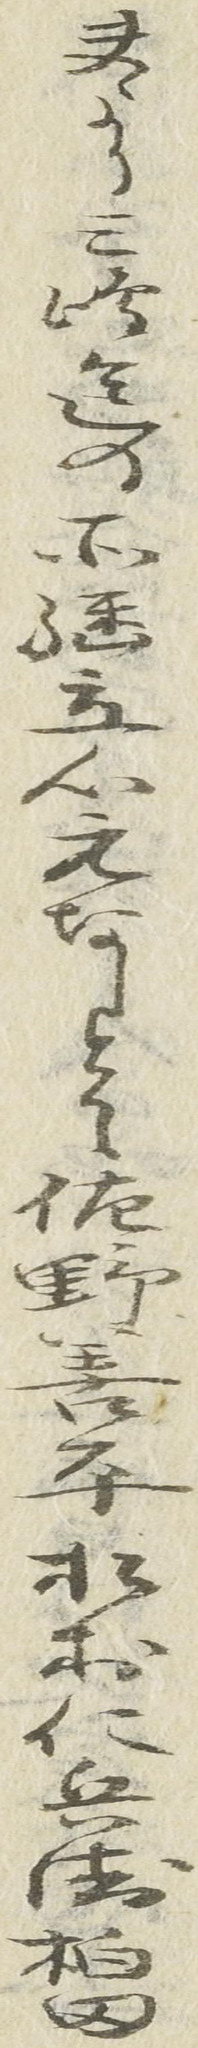夫より三嶋迄の所継立心元なしとて佐野善平松村仁兵衛柏田
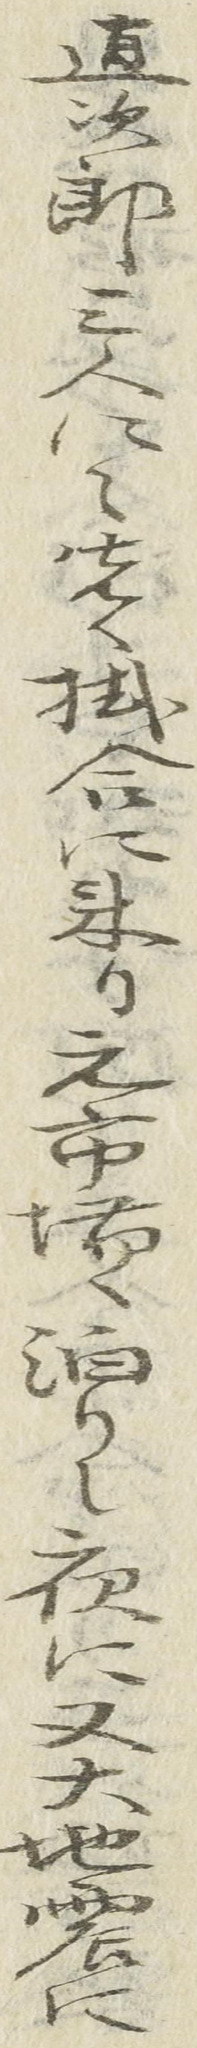直次郎三人にて先へ掛合に来り元市場へ泊りし夜に又大地震に
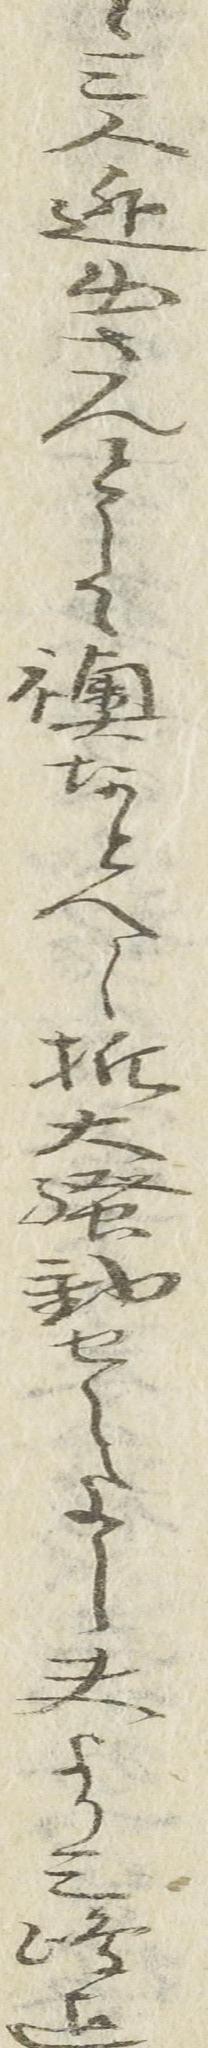て三人逃げ出さんとして襖なとへし折大騒動せしよし夫より三嶋迄
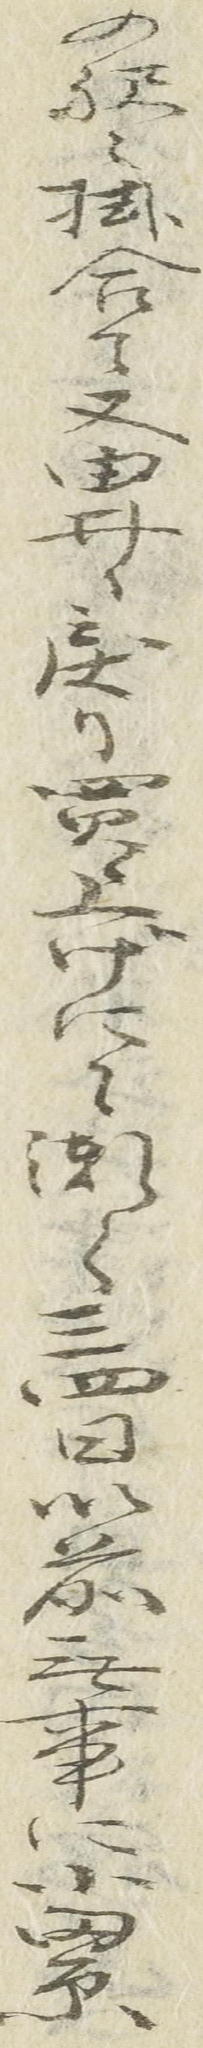の駅々掛合て又由井へ戻り買上げにて漸く三四日以前無事に小田原
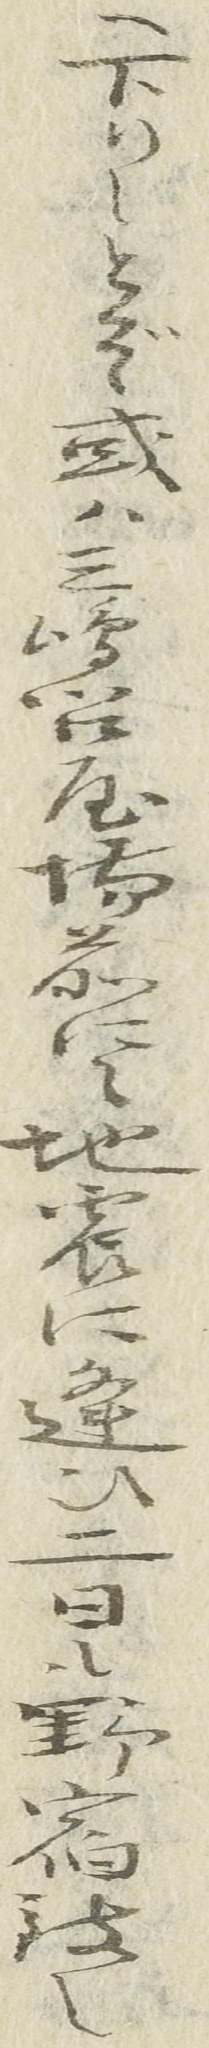へ下りしとぞ或は三嶋問屋場前にて地震に逢ひ二日も野宿致し
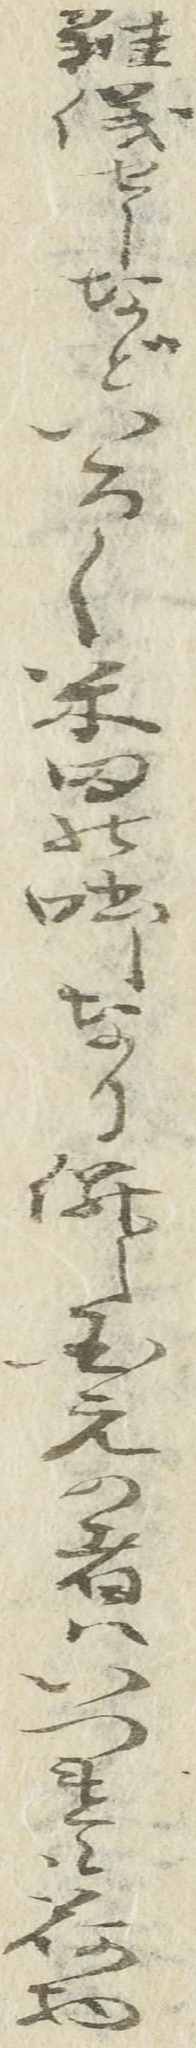難儀せしなどいろ〳〵米田の咄しなり併し国元の者はいつれも荷物
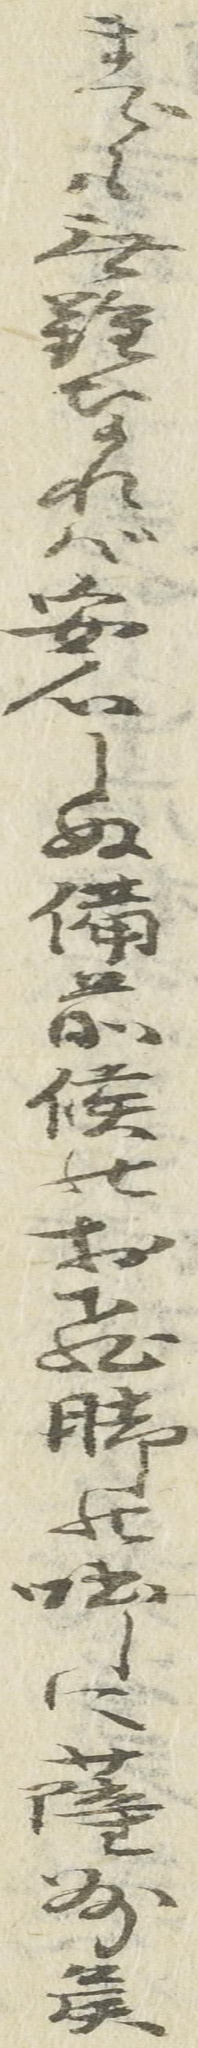までも無難なれば安心しぬ備前侯のお飛脚の咄しに薩州侯
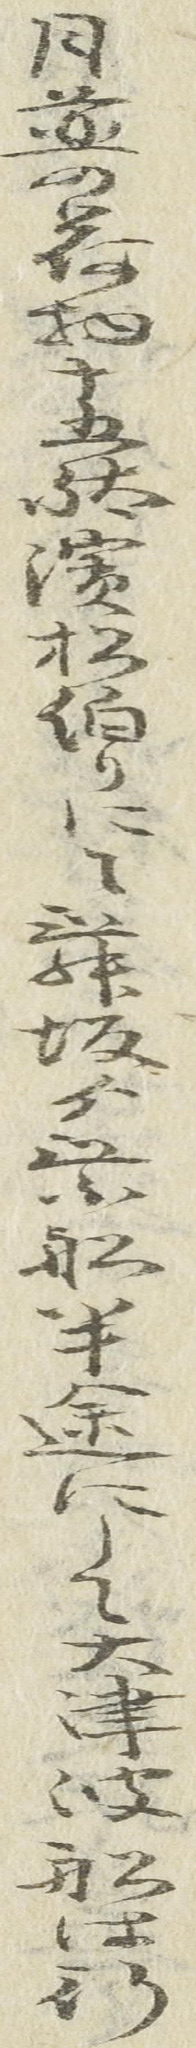月並の荷物十五駄濱松伯りにて舞坂ゟ乗舩半途にして大津波舩は行
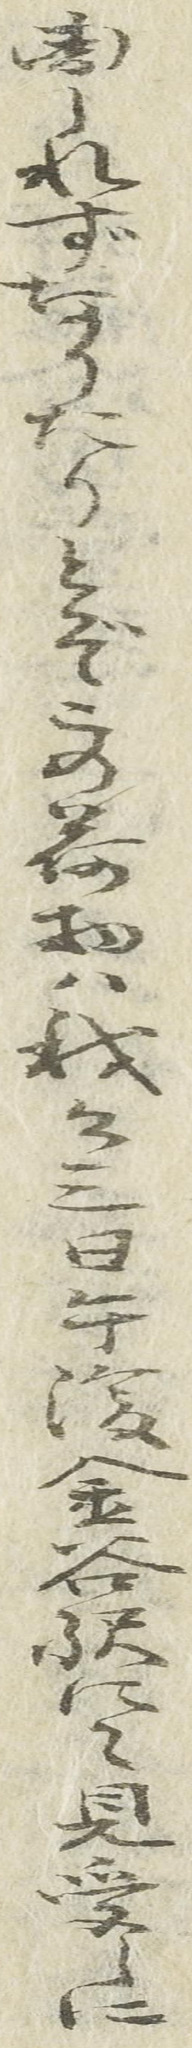衛しれずなりたりとぞこの荷物は我々三日午後金谷駅にて見受しに
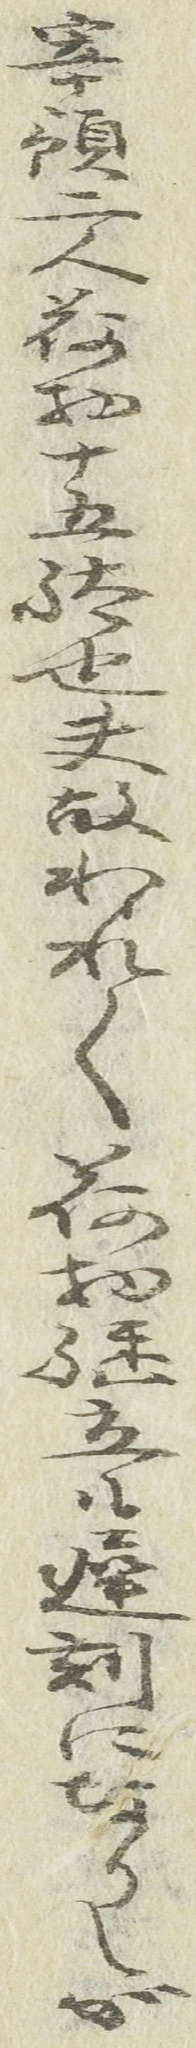宰領二人荷物十五駄也夫故われ〳〵荷物継立も遅刻になりしが
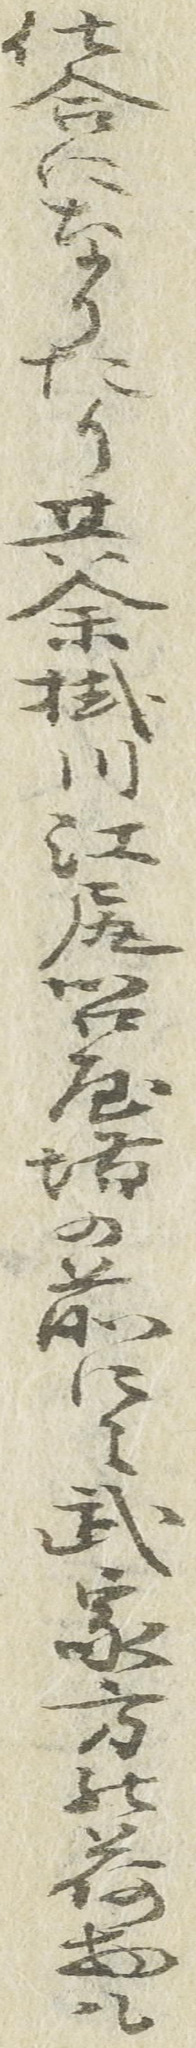仕合になりたり其余掛川江尻問屋場の前にて武家方の荷物も
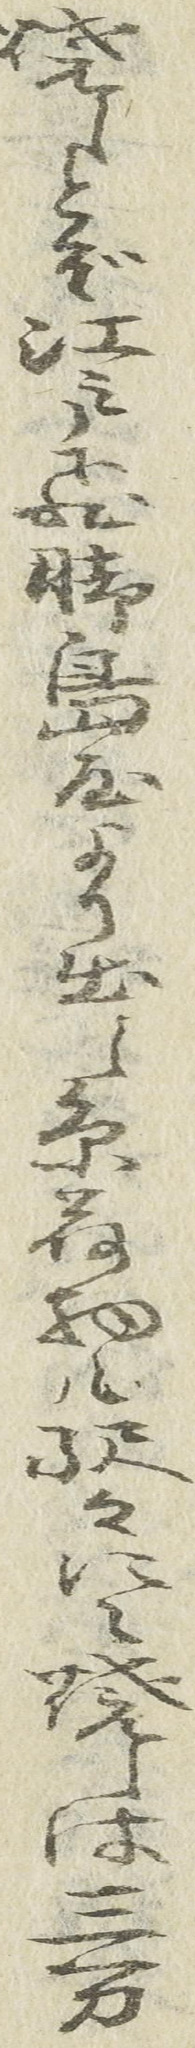焼しとぞ江戸飛脚島屋より出し糸荷物も駅々にて焼しは三万
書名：地震前兆集　全
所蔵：東京大学地震研究所図書室 Earthquake Research Institute Library, The University of Tokyo, JAPAN
